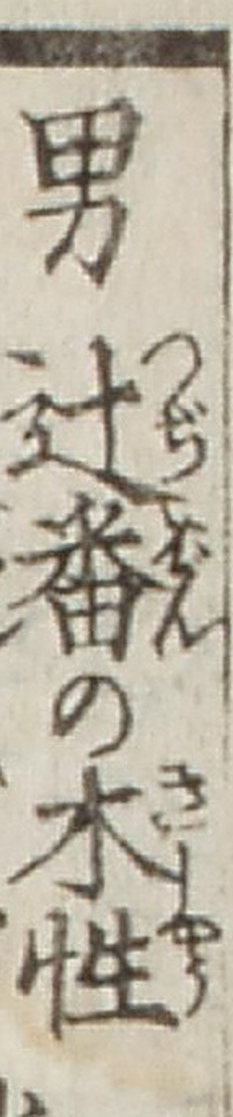男辻番の木性
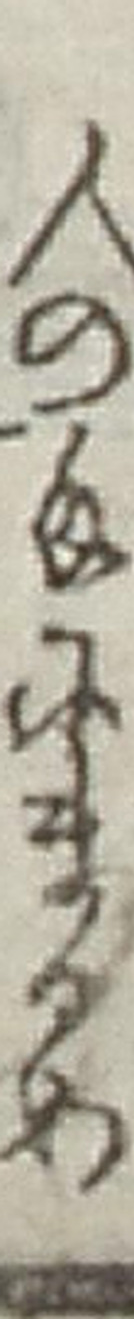人のま？にまるめ
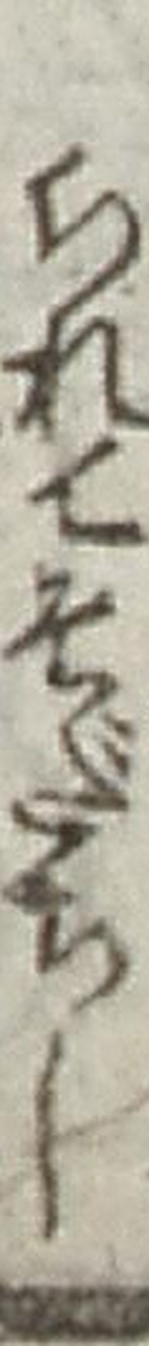られてそだちし
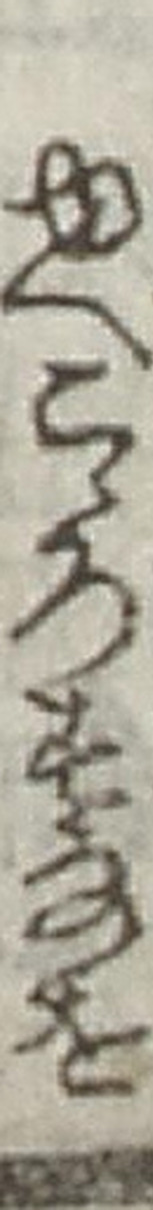ゆへこゝろすなを
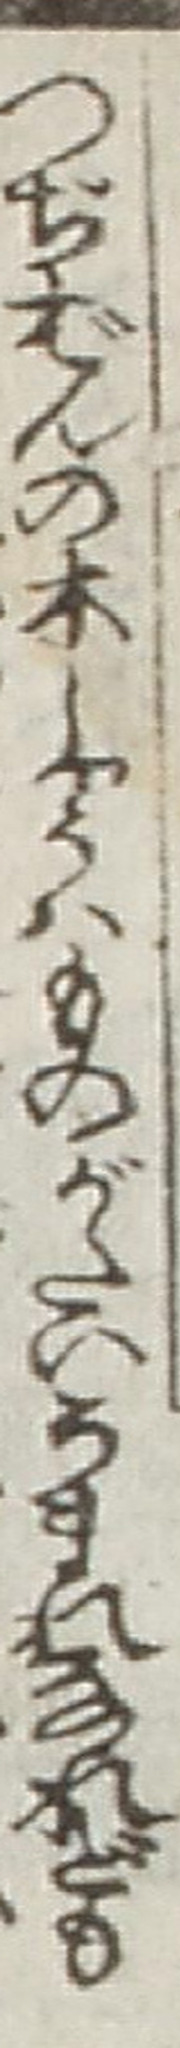つぢばんの木しやうはものがたいうまれなれども
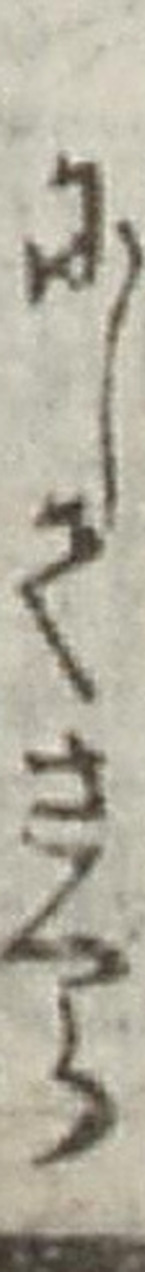にしてさくら
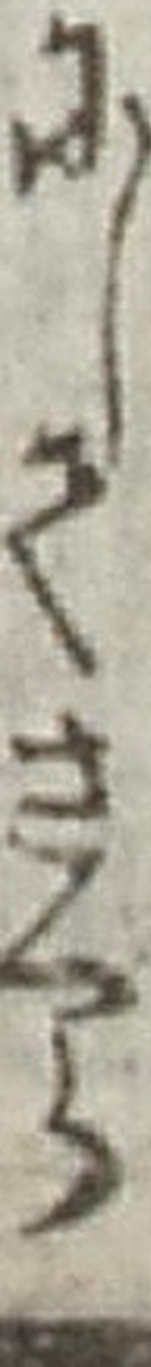にしてさくら
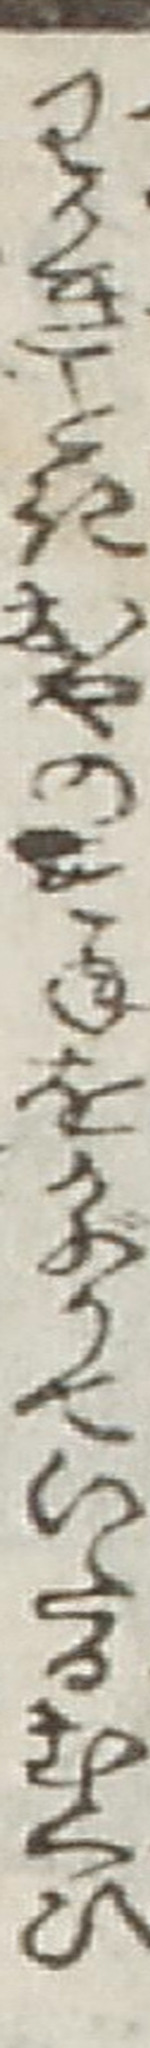わかきときおやのすねをかぶりていたるむくひ
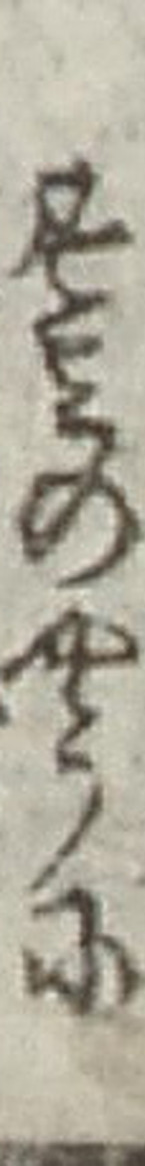すみのやうに
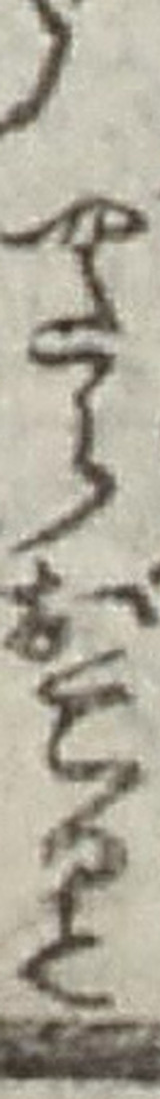やたらおこると
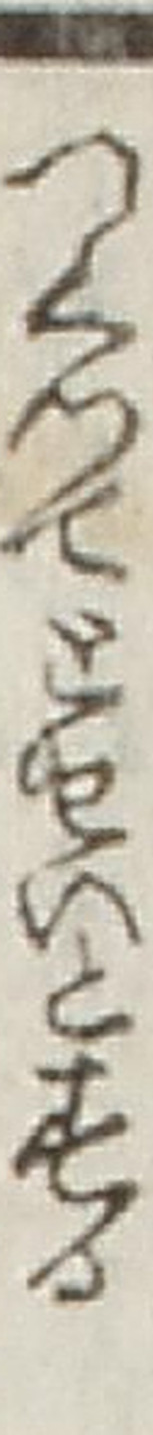つくつてとせいとする
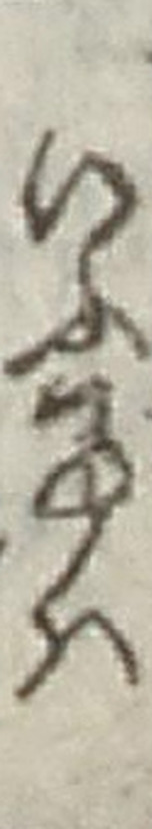いふ事は
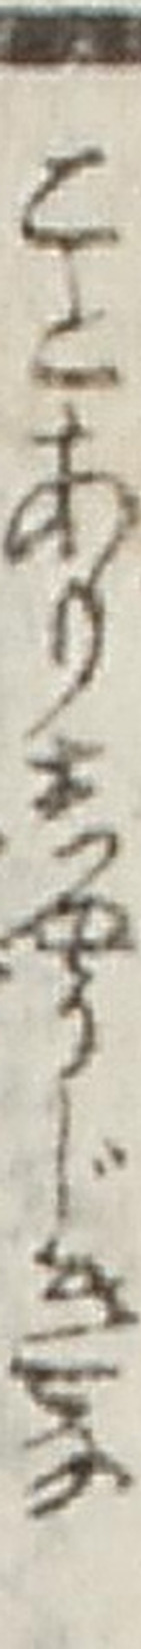ことありしやうじきな
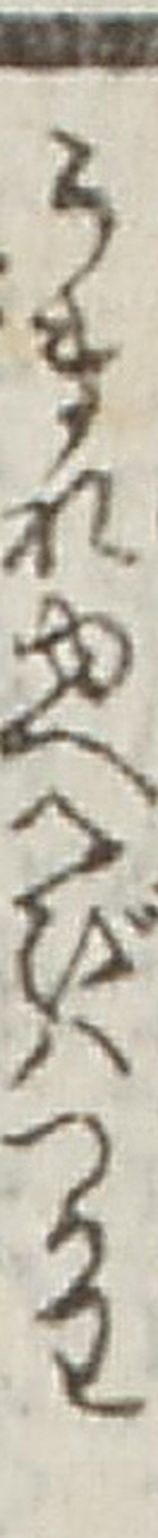うまれゆへへびはつかわ
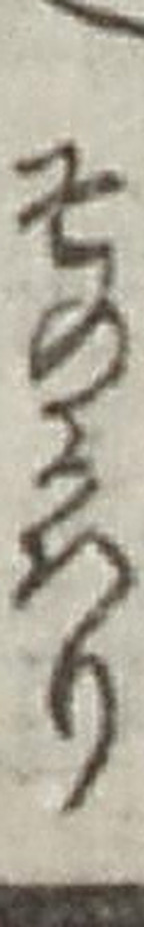そのかはり
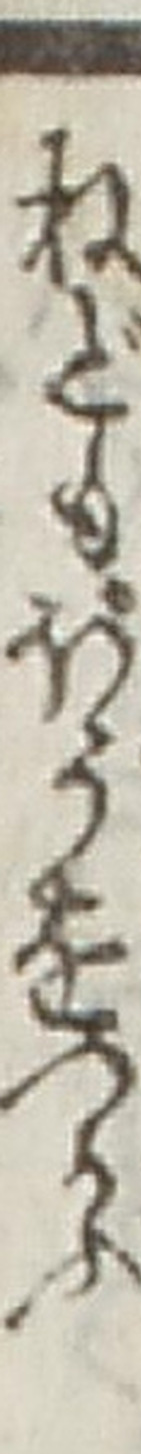ねどもほうをつかう
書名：三世相出雲當座帳　上下冊
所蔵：東京大学地震研究所図書室 Earthquake Research Institute Library, The University of Tokyo, JAPAN
